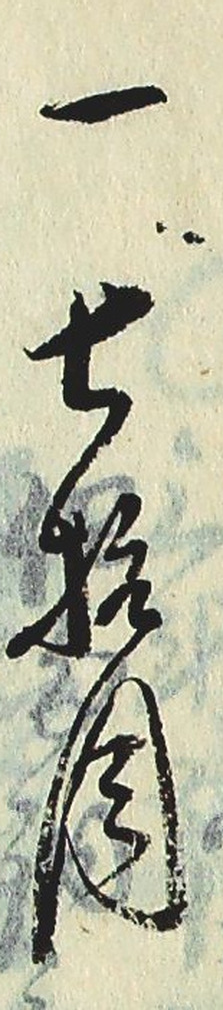一七拾目
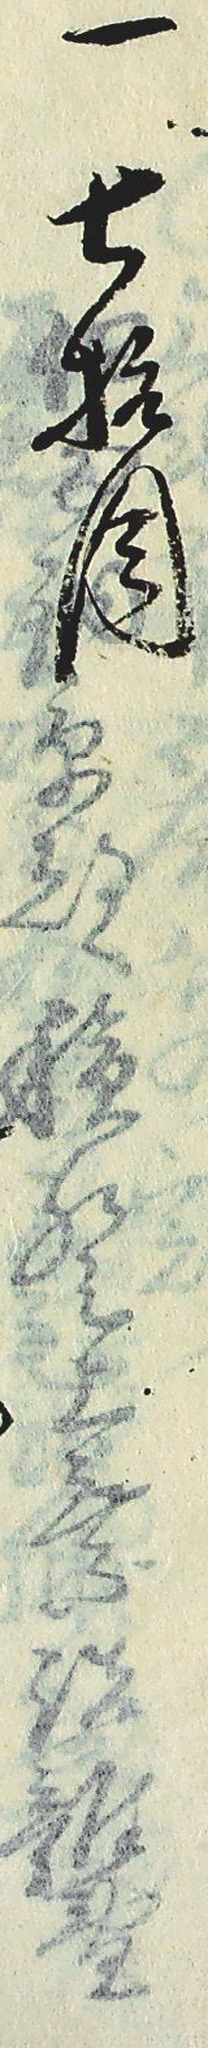一七拾目
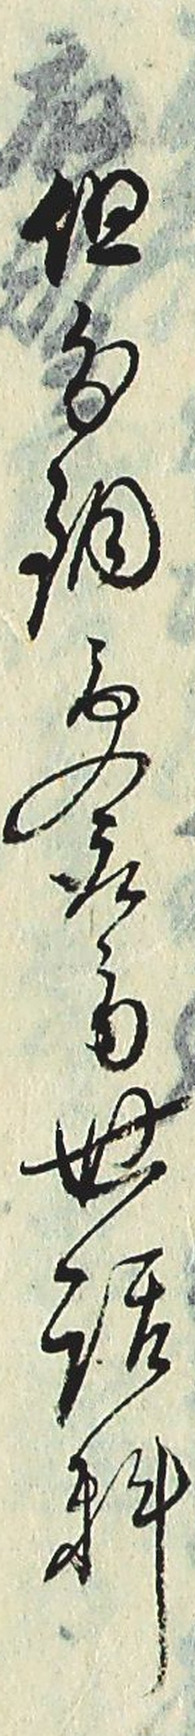但分銅受取方世話料

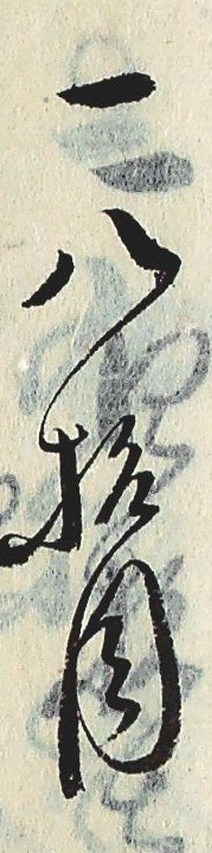一八拾目
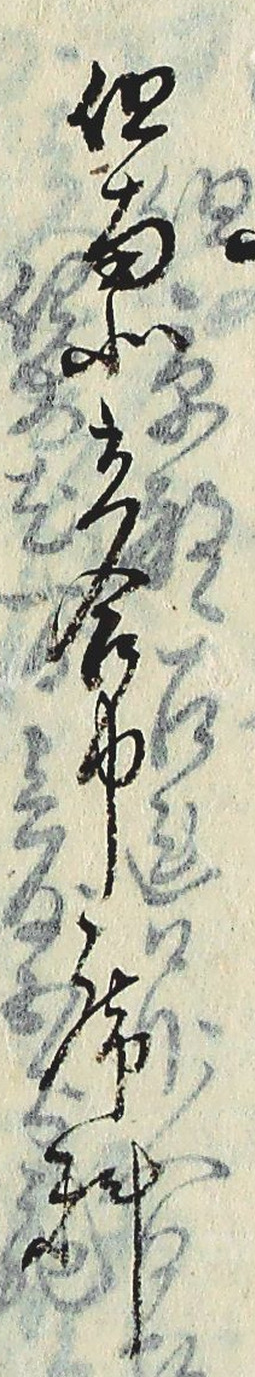但南北立合中席料
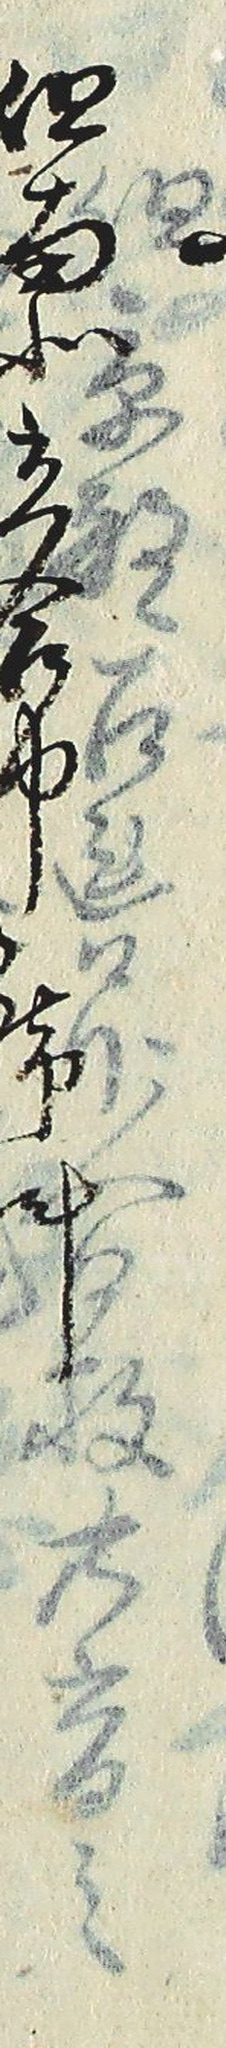但南北立合中席料
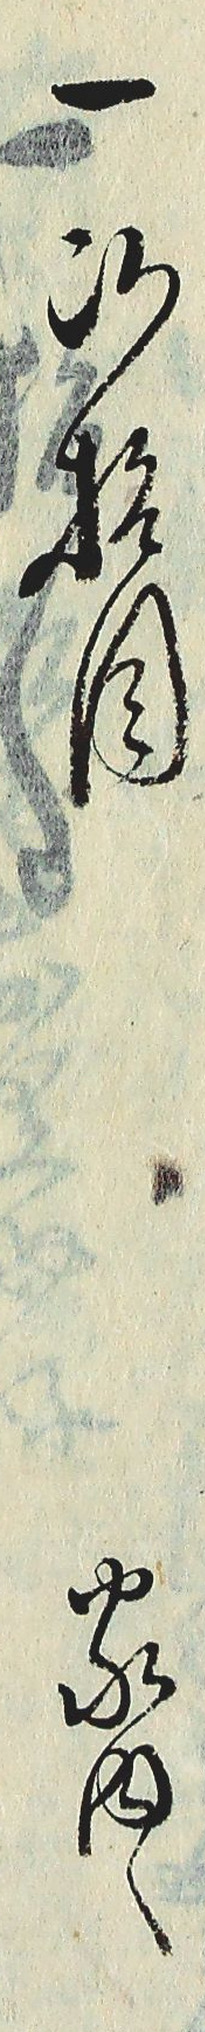一弐拾目家内へ
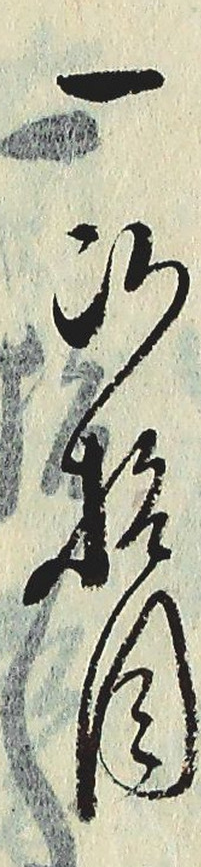一八拾目
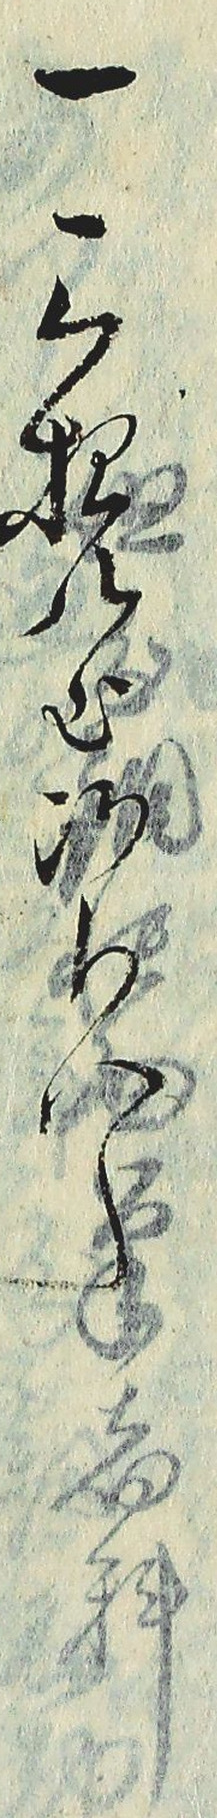一三拾八匁弐分八厘
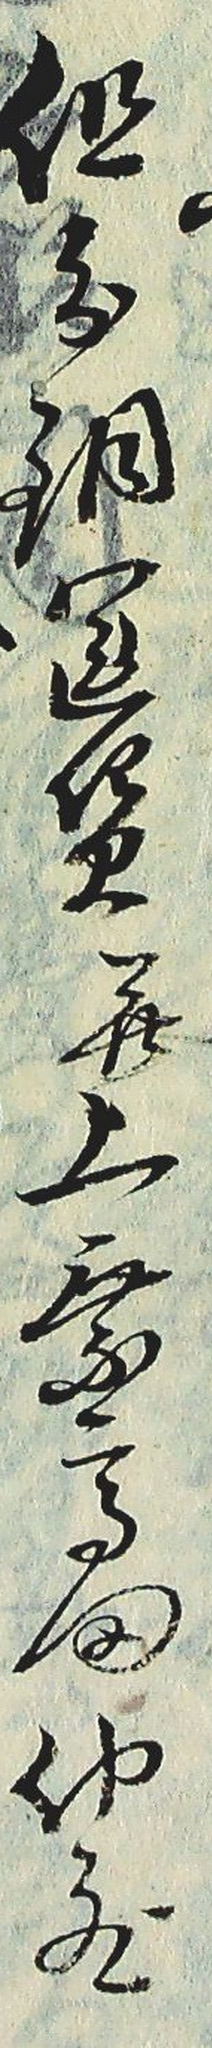但分銅運賃并上乗高田仲蔵
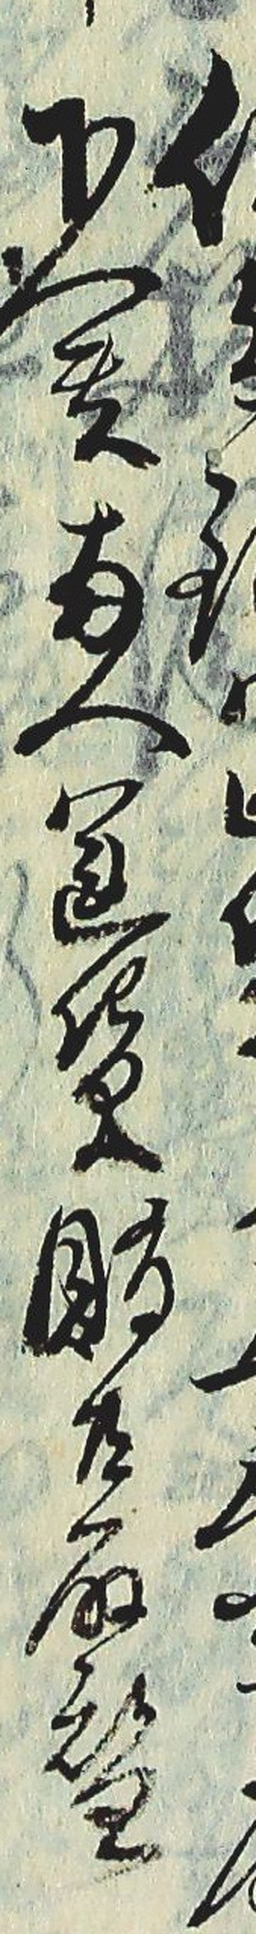下人共両人運賃賄共取替
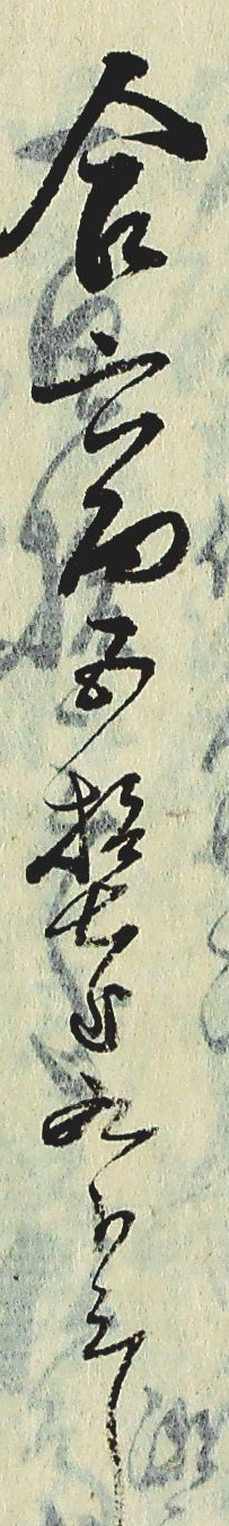合六百五拾七匁九分三厘
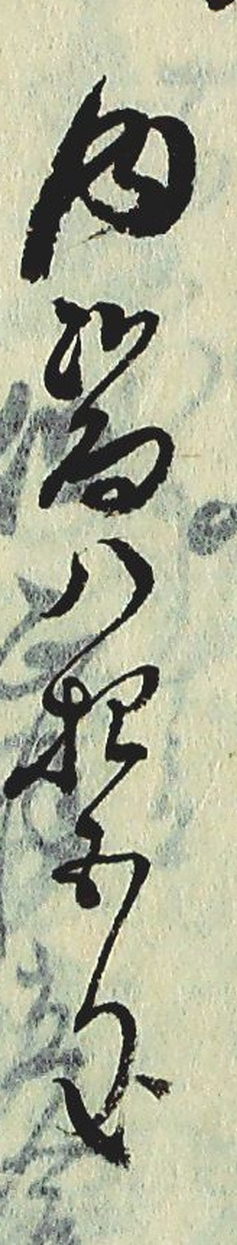内弐百八拾五匁
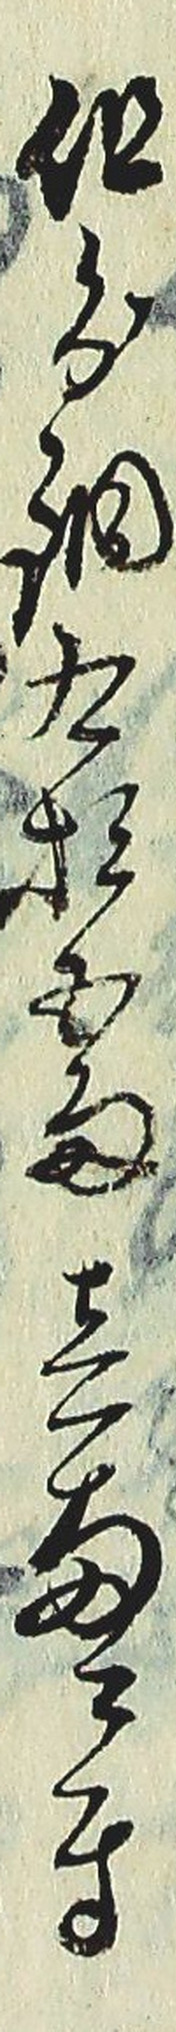但分銅九拾五両壱両に付
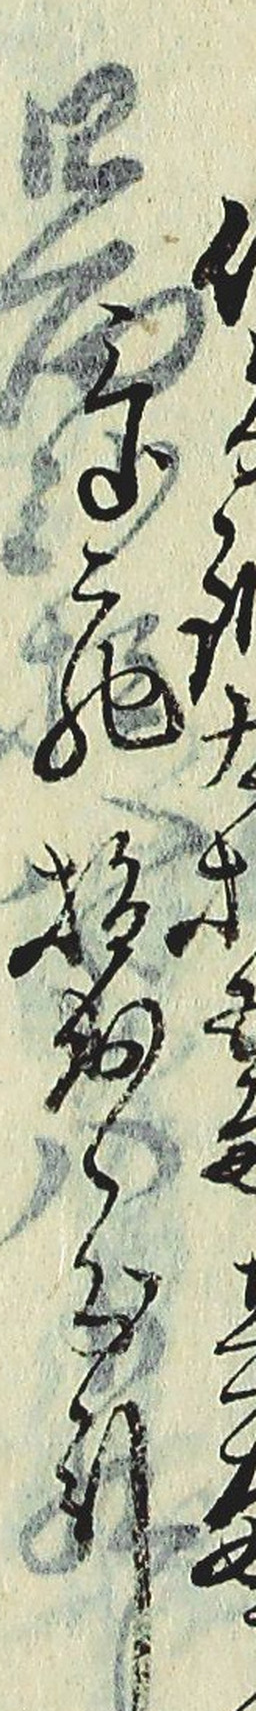三匁宛指出候分引
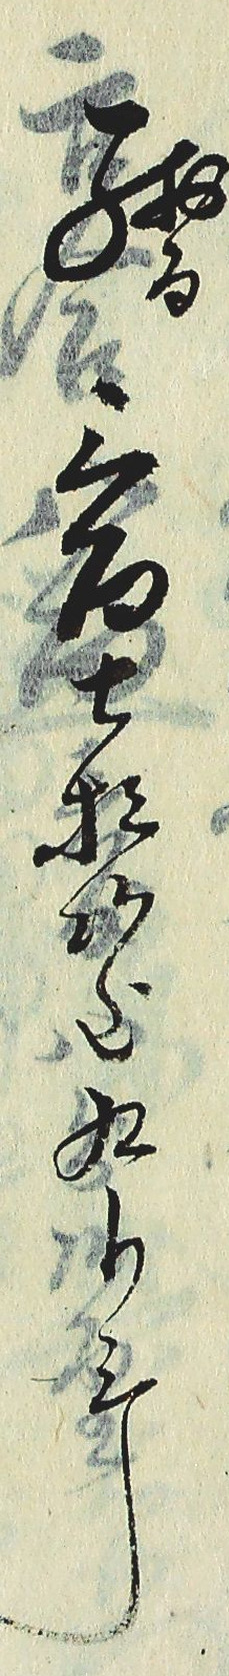残て三百七拾弐匁九分三厘
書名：名東郡中諸割賦元帳
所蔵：鳴門教育大学 Naruto University of Education
